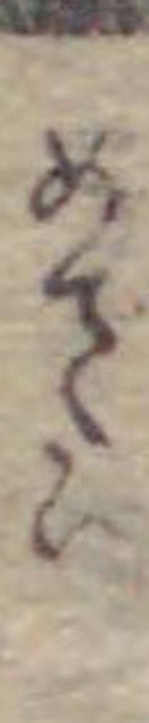めでたひ
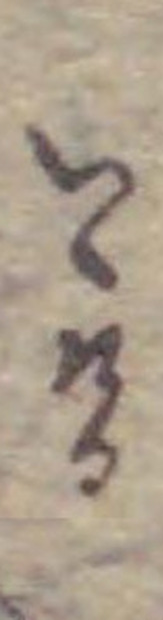いゝける

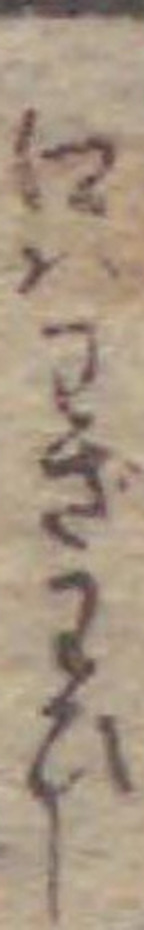口はわさわひ
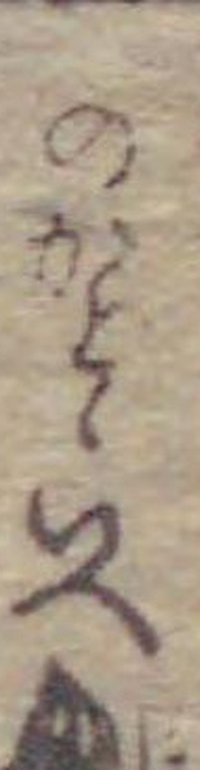のかとといへ
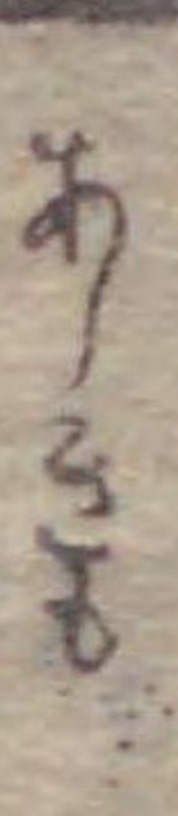あしきも
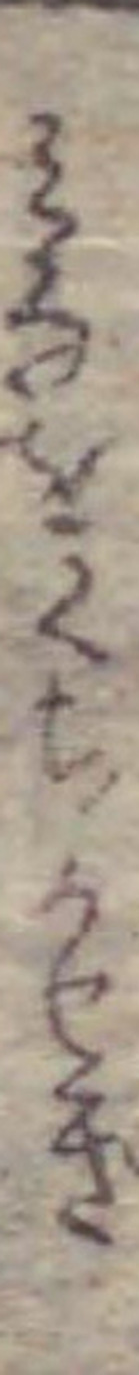みなをくちかせぎ
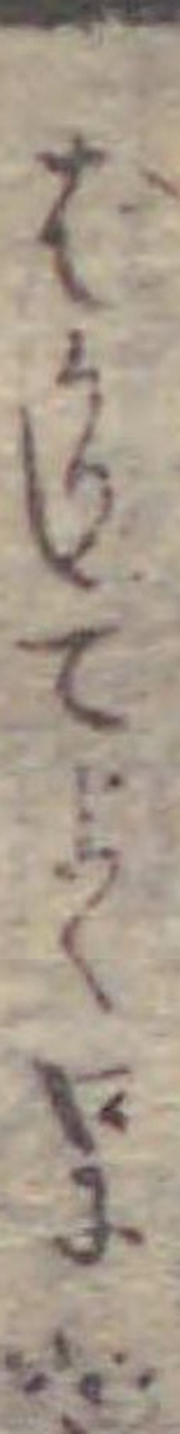ばかりしてよく口に
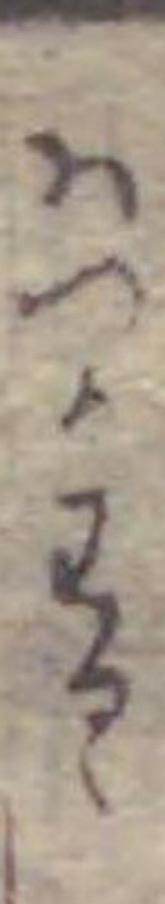はつかわるゝ
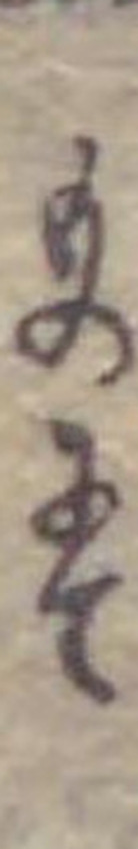ものにて
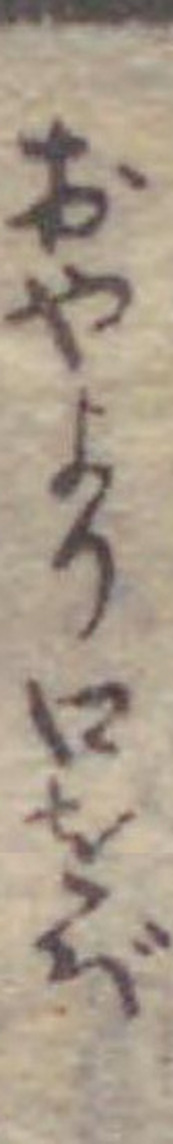おやより口をば
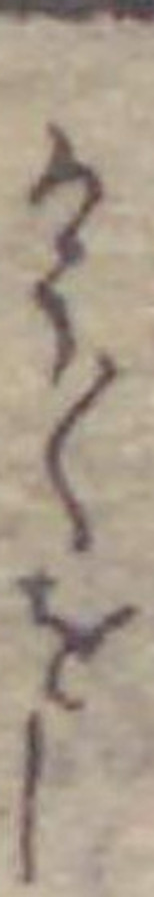かうかうをし
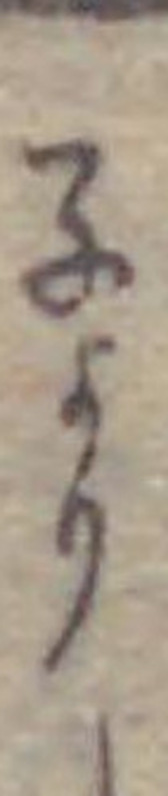子より
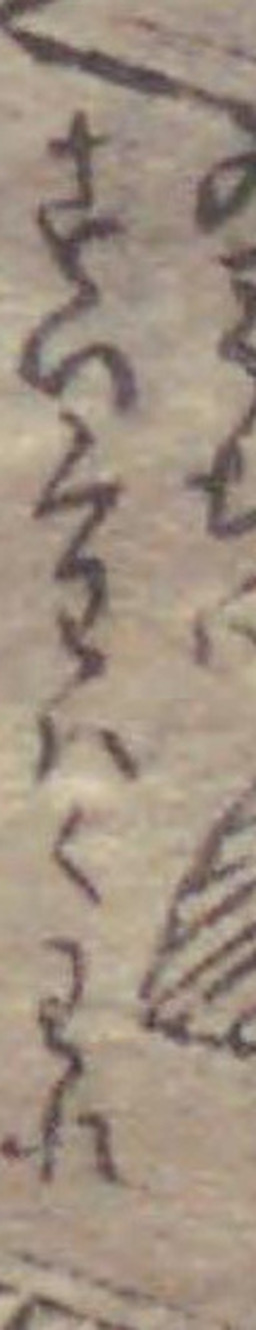すいくわはくわれ
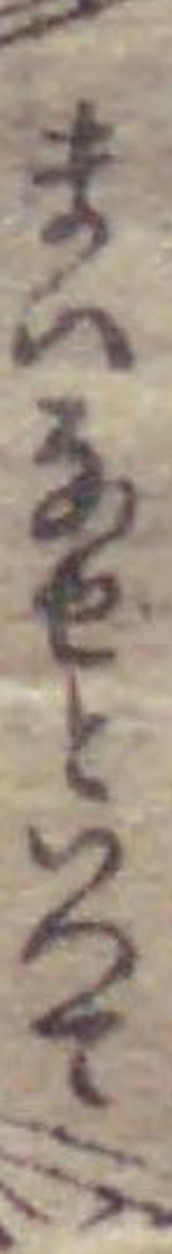まいなせといつて
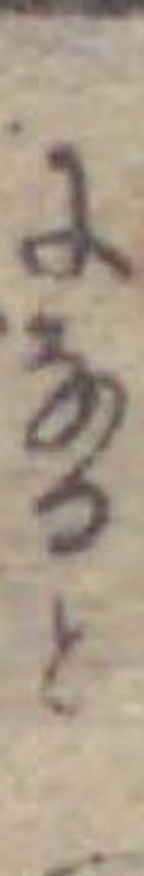になると
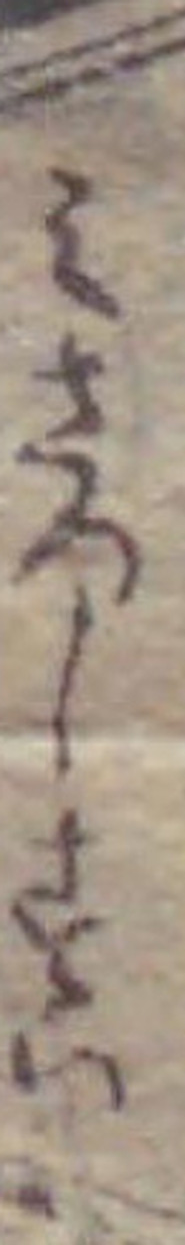みさつしすい
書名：五躰不具毒解薬 : 3巻
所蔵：国立国会図書館 National Diet Library, JAPAN
